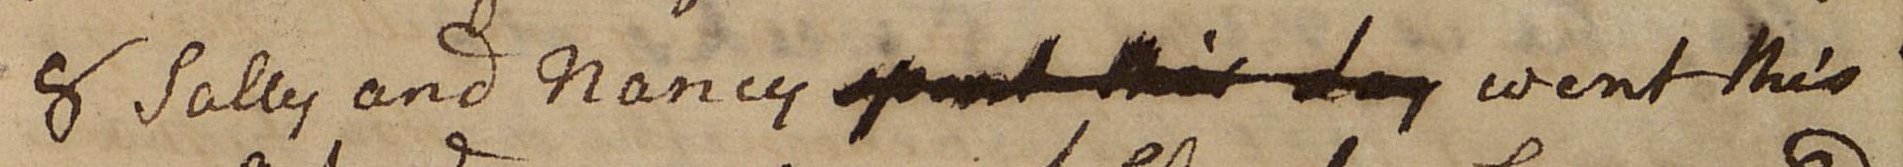8 Sally and Nancy [spent their day] went this
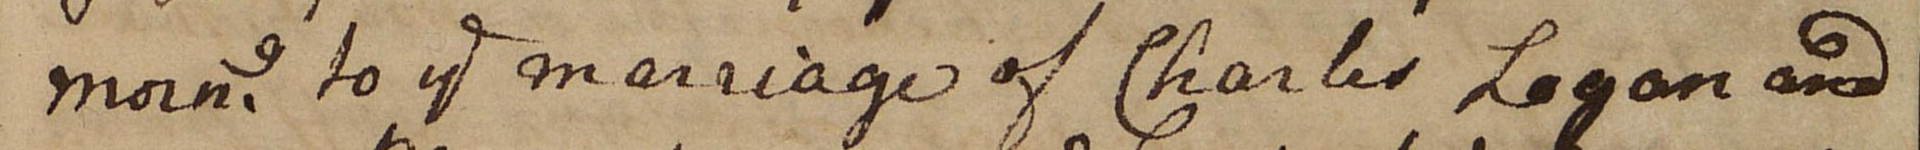morn^g. to y^e marriage of Charles Logan and
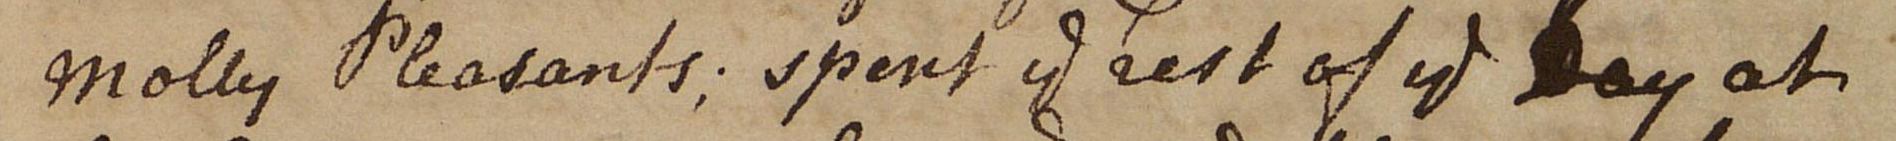Molly Pleasants; spent y^e rest of y^e Day at
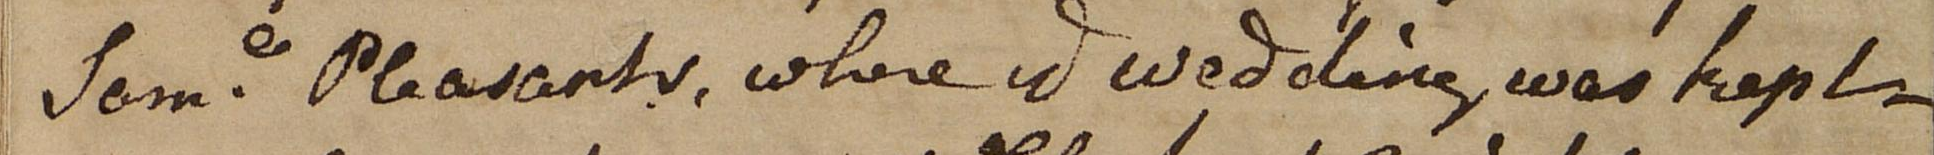Sam^l. Pleasants, where y^e wedding was kept-
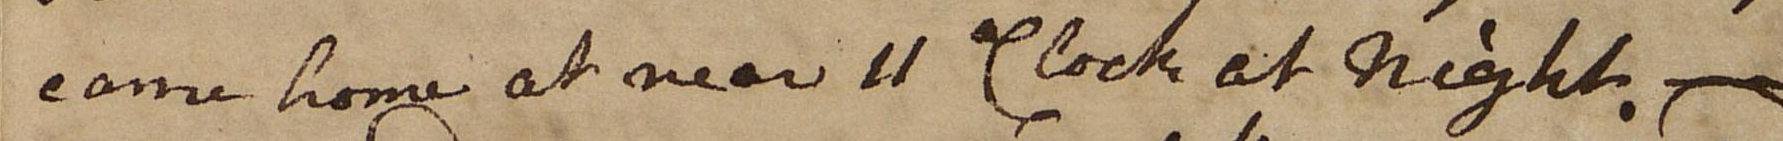came home at near 11 ^oClock at night.-
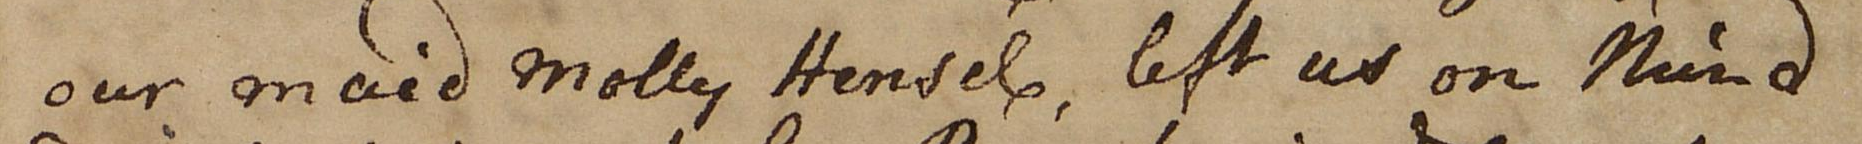our maid Molly Hensel, left us on third
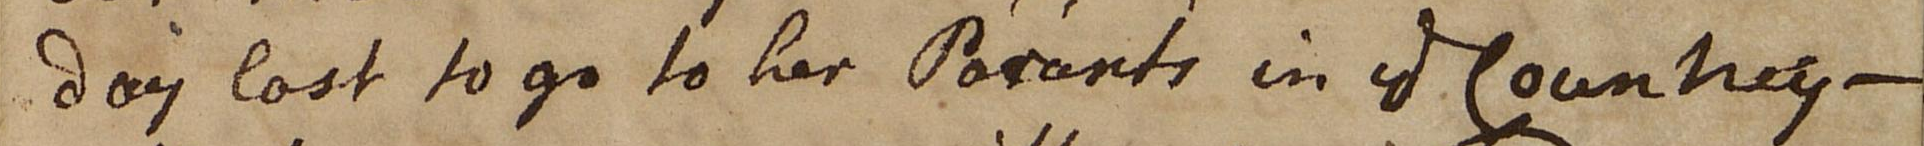day last to go to her Parants in y^e Countrey-
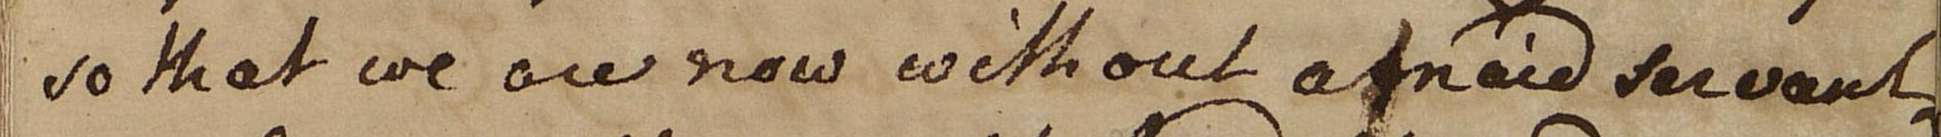so that we are now without a maid servant,
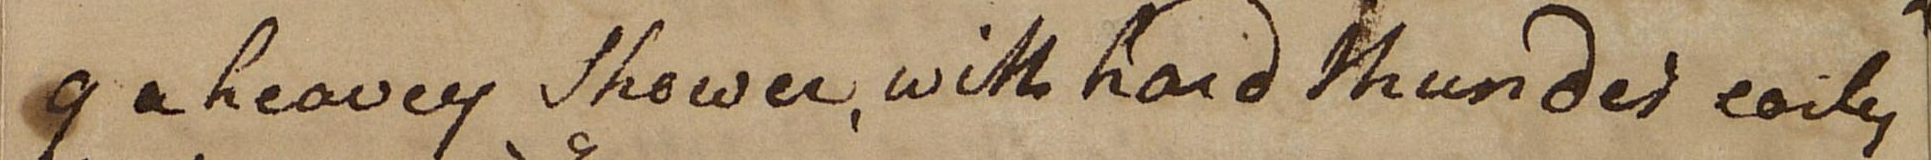9 a heavey Shower, with hard thunder early
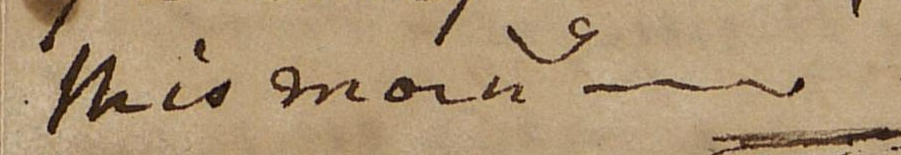this morn^g.--
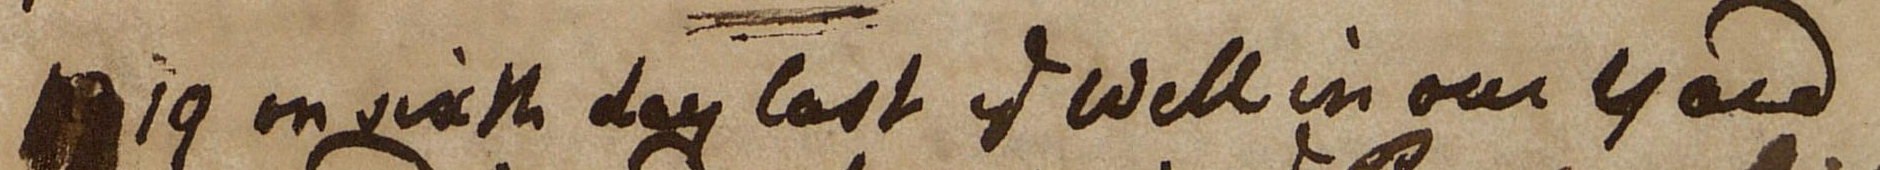[__]19 on sixth day last y^e well in our yard
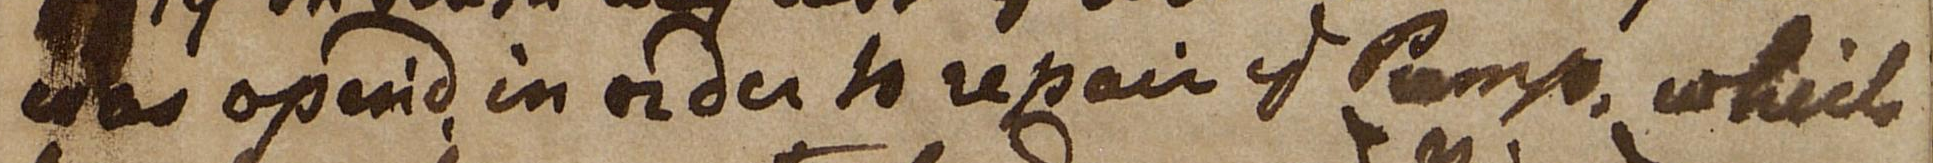was open'd in order to repair y^e Pump, which
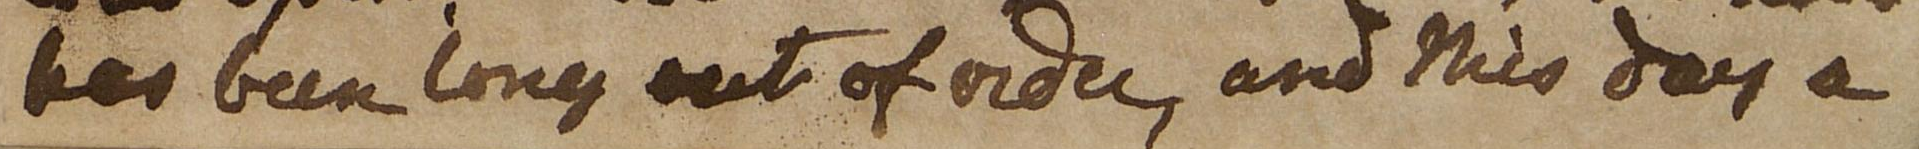has been long out of order, and this day a
